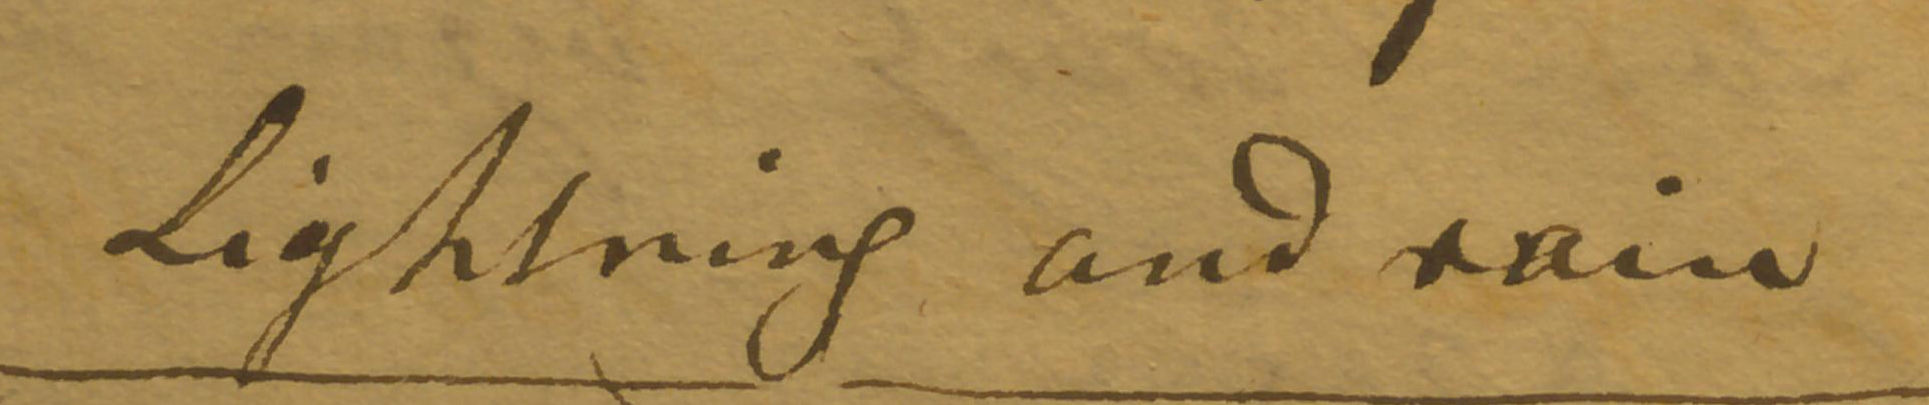Lightning and rain
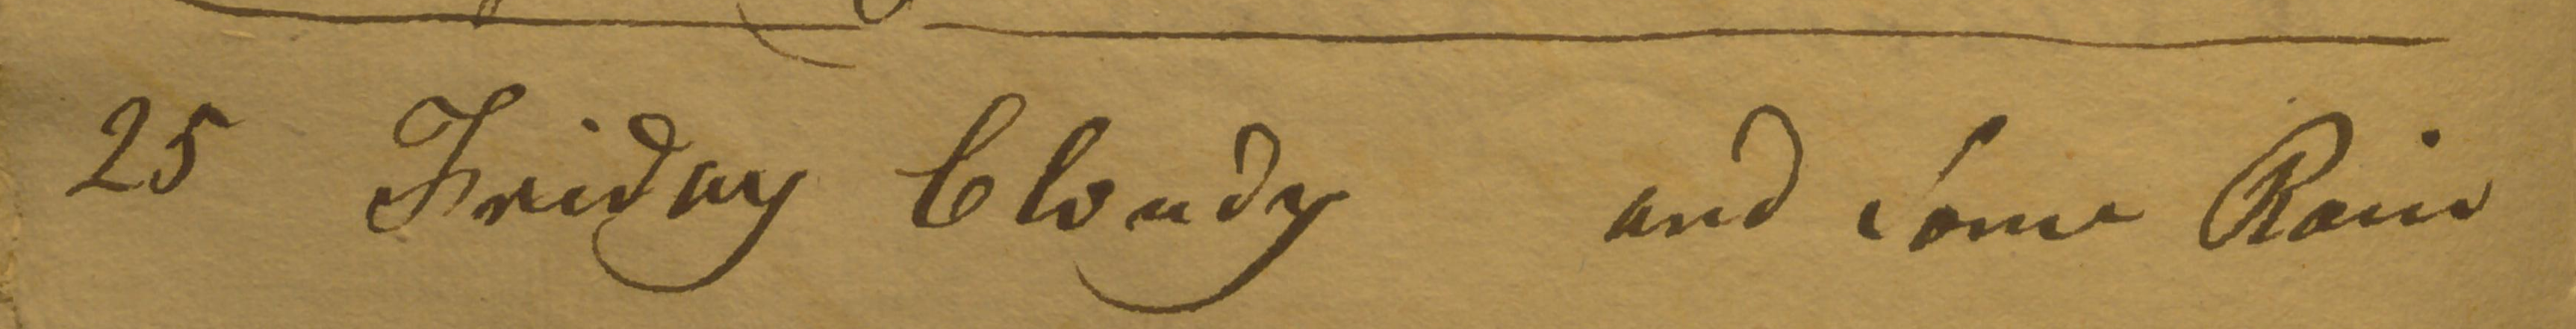25 Friday Cloudy and some Rain
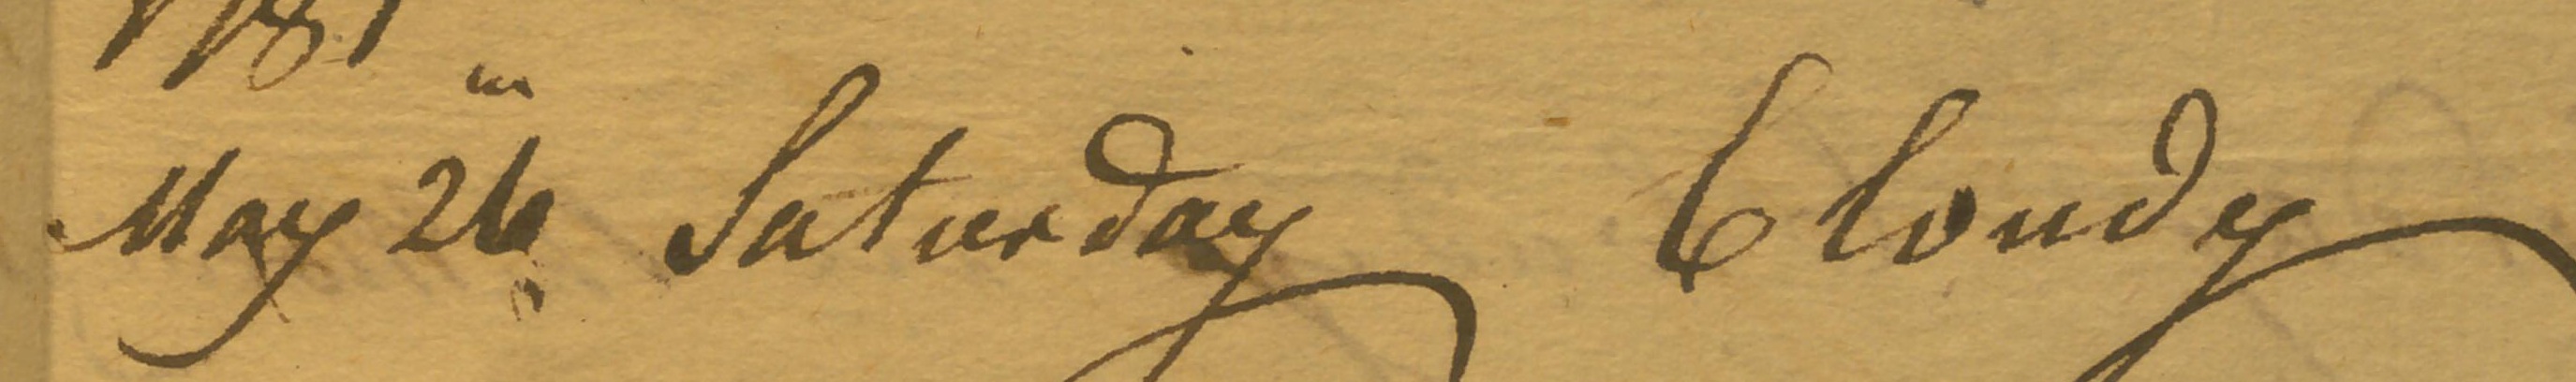May 26 Saturday Cloudy
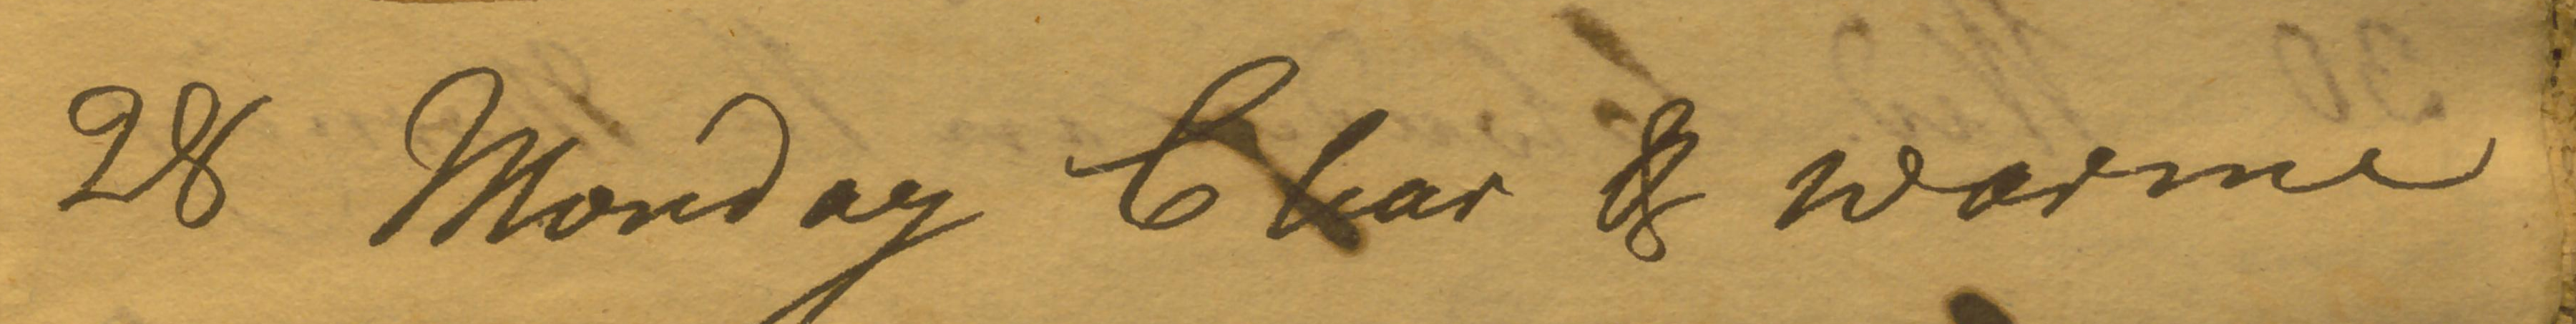28 Monday Clear & warme
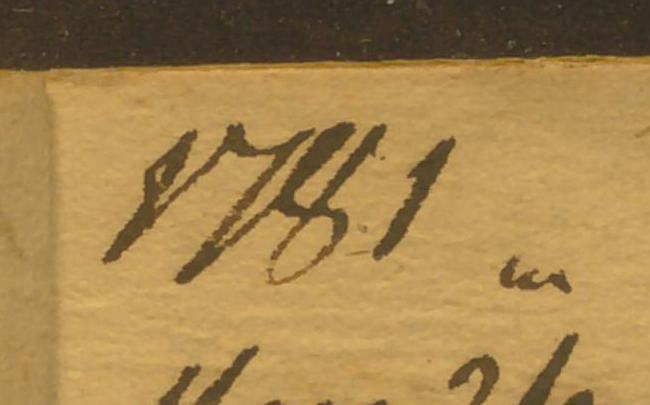1781
